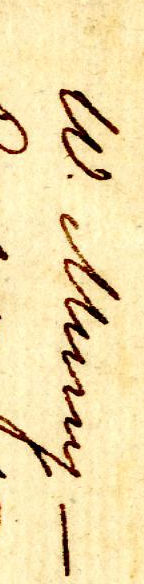W. Murry-
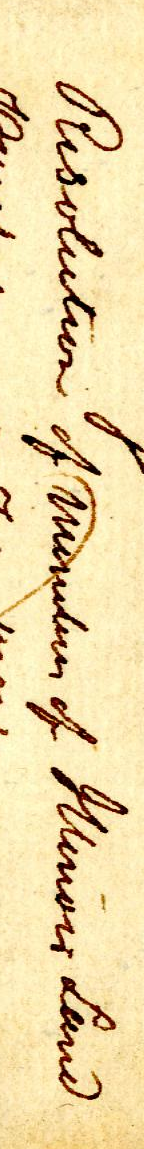Resolution of members of Illinois Land
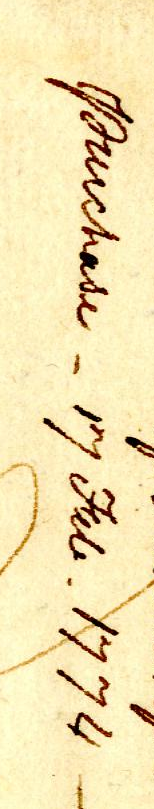Purchase- 17 Feb. 1774
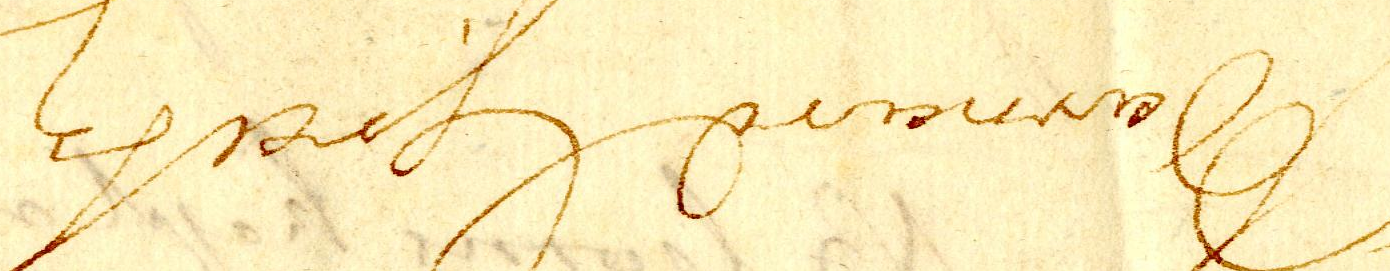Barnard Gratz
